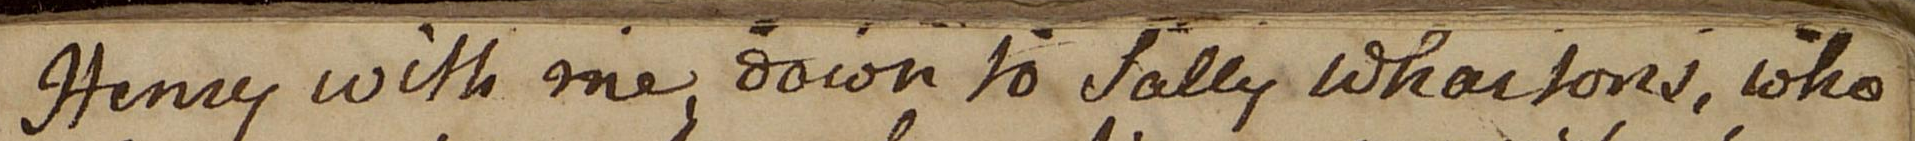Henry with me, down to Sally Whartons, who
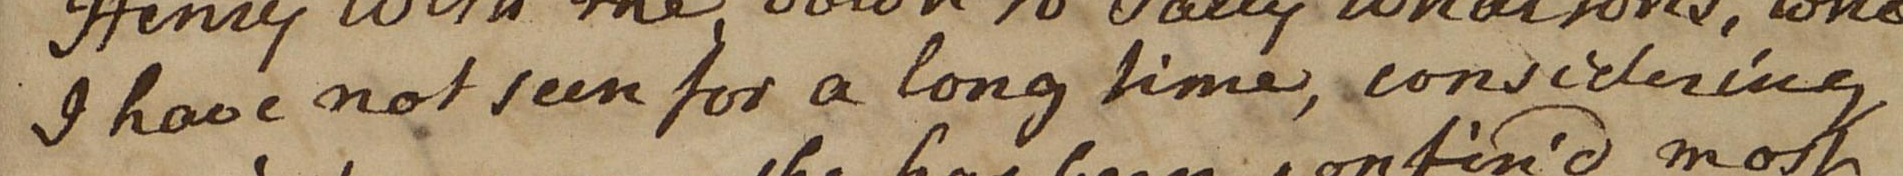I have not seen for a long time, considering
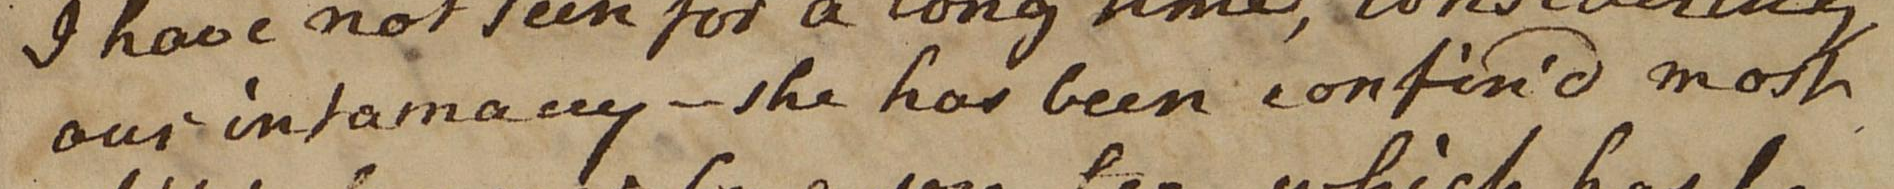our intamacey- she has been confin'd most
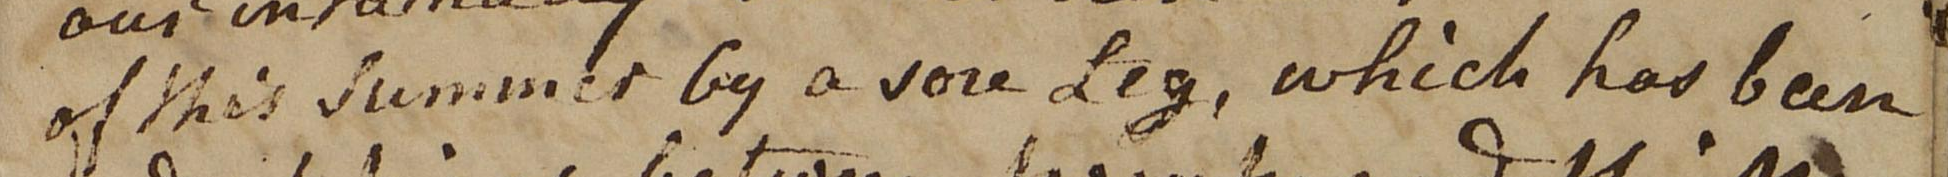of this Summer by a sore Leg, which has been
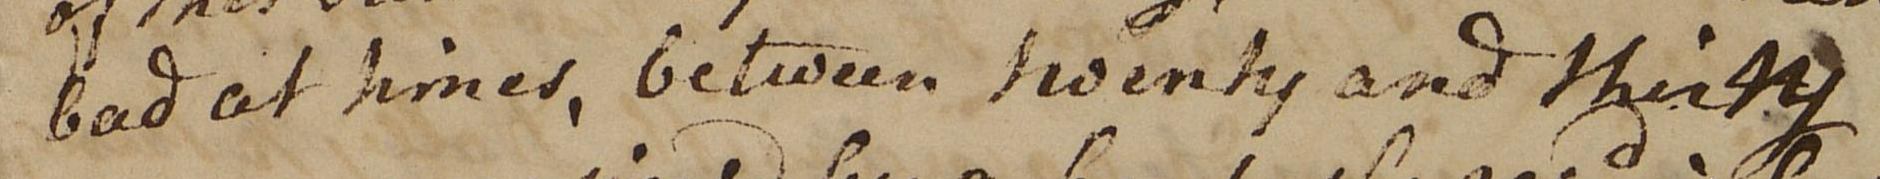bad at times, between twenty and thirty
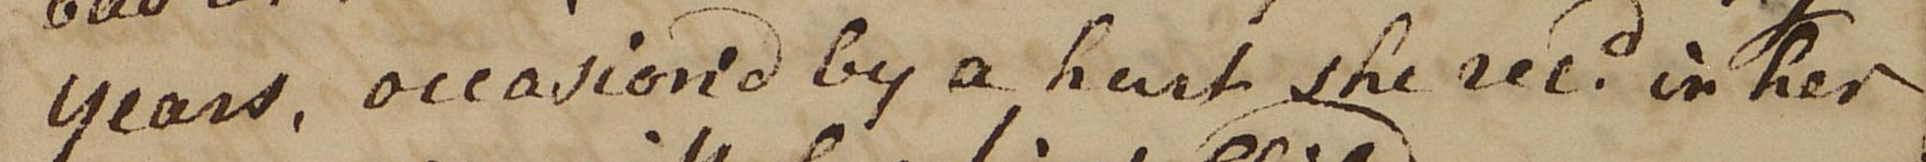Years, occasion'd by a hurt she rec^d. in her
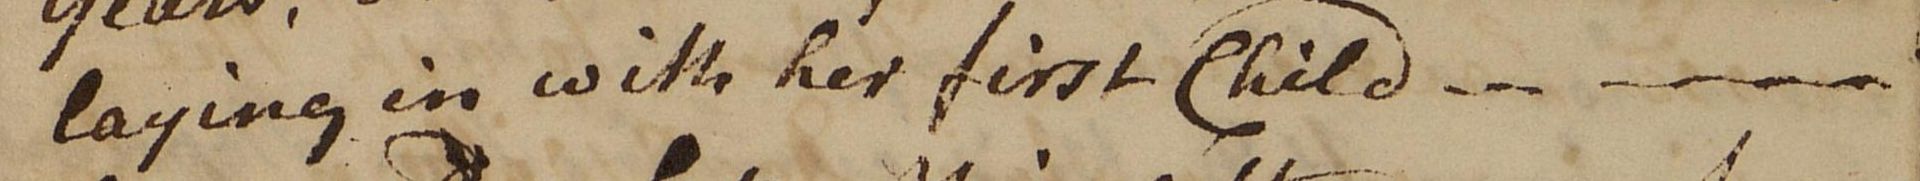laying in with her first Child--
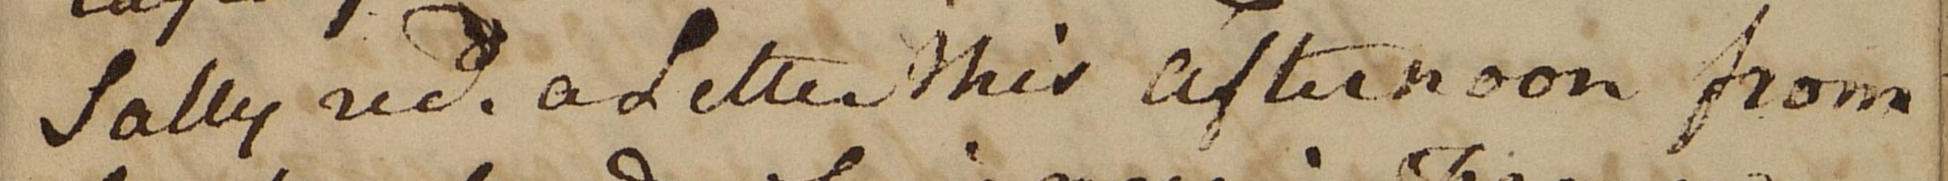Sally rec.^d a Letter this afternoon from
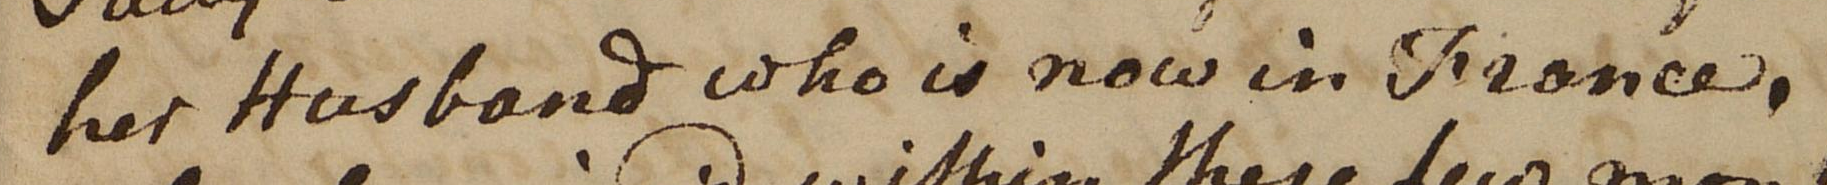her Husband who is now in France,
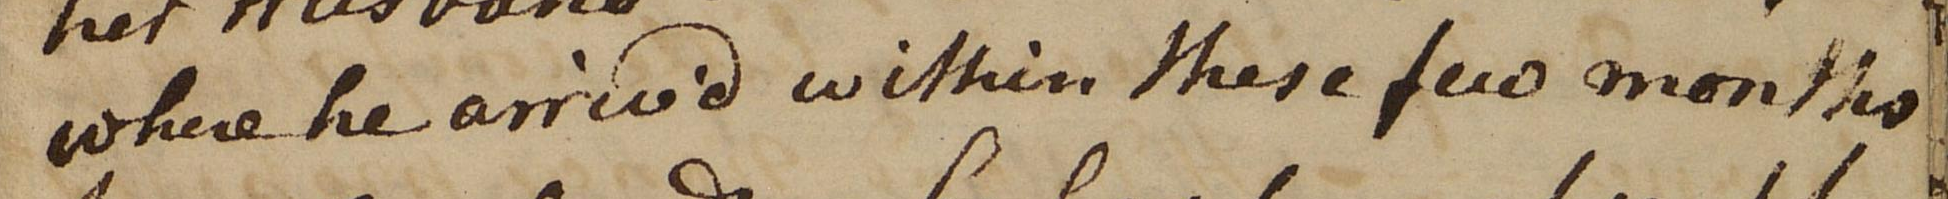where he arriv'd within these few months
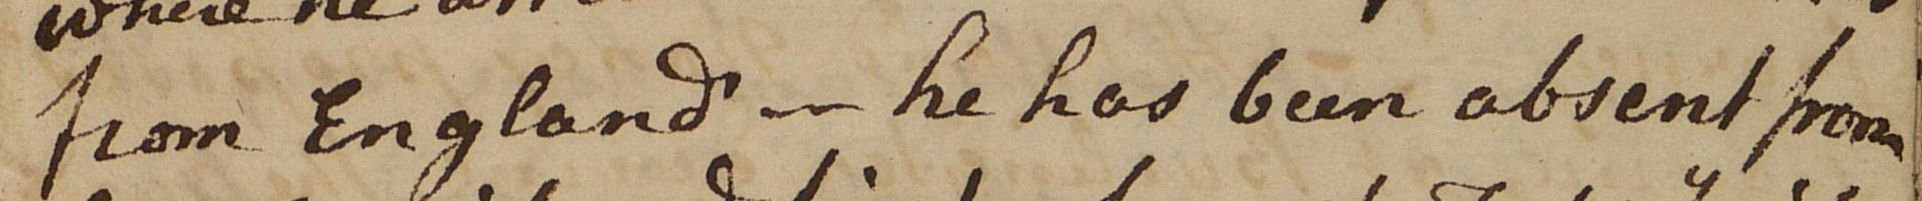from England- he has been absent from
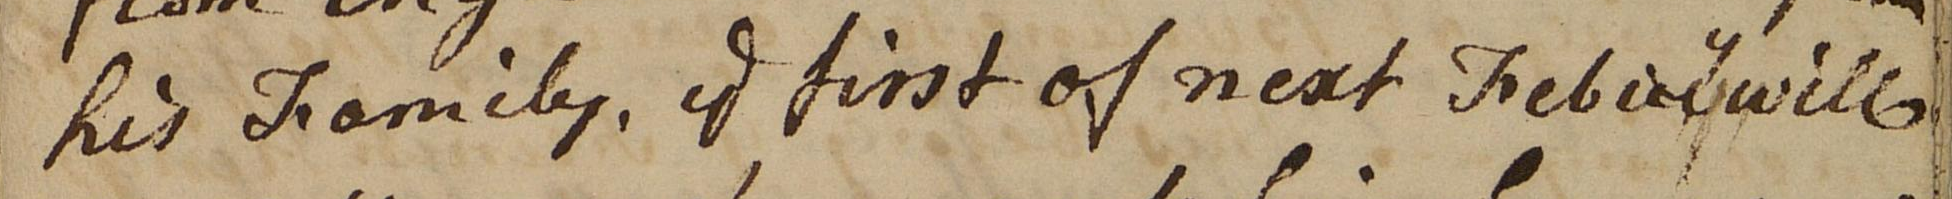his Family, y^e first of next Febru^y will
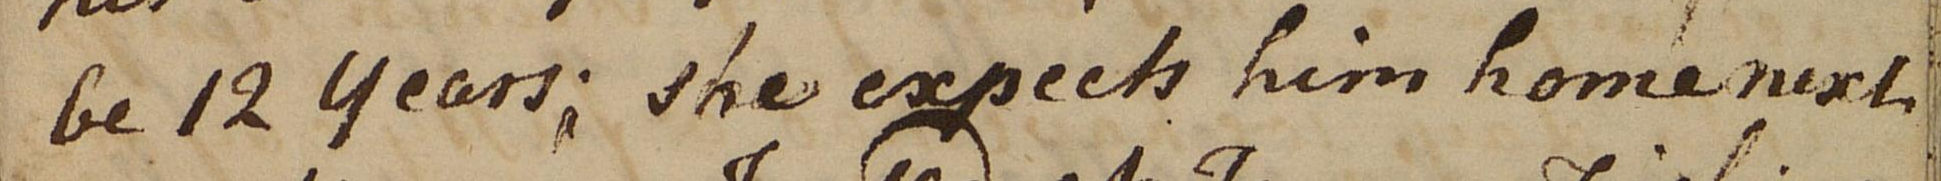be 12 years; she expects him home next
